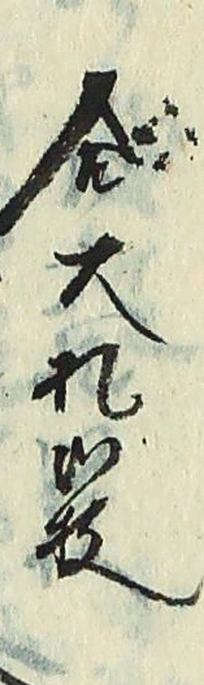合大札弐枚
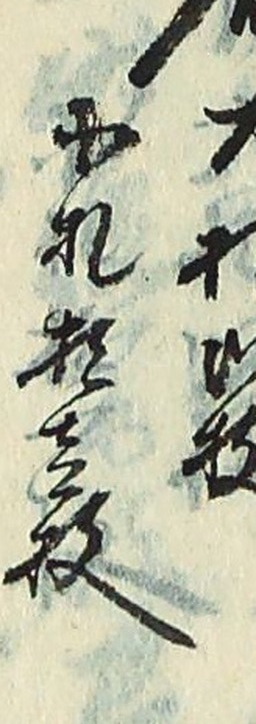小札拾壱枚
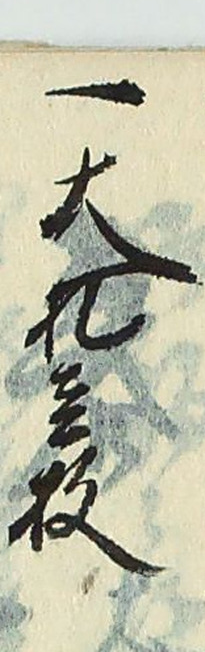一小札壱枚同
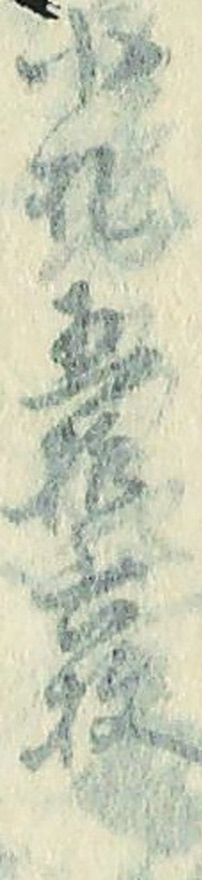小札拾壱枚
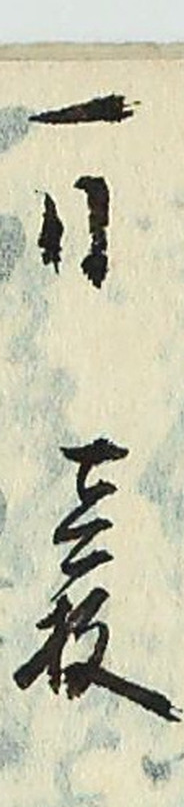一同壱枚同
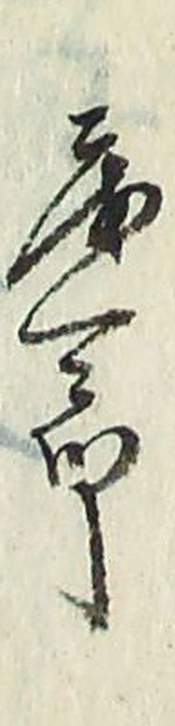茂一郎
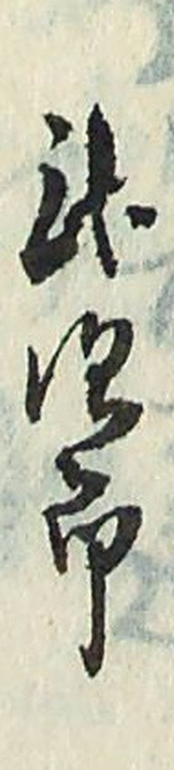此次郎
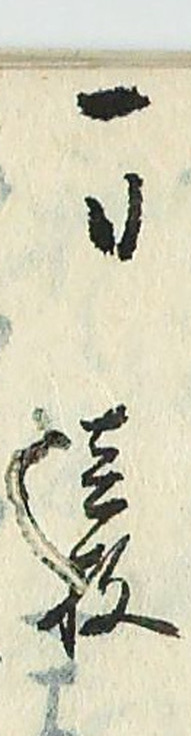一同壱枚同
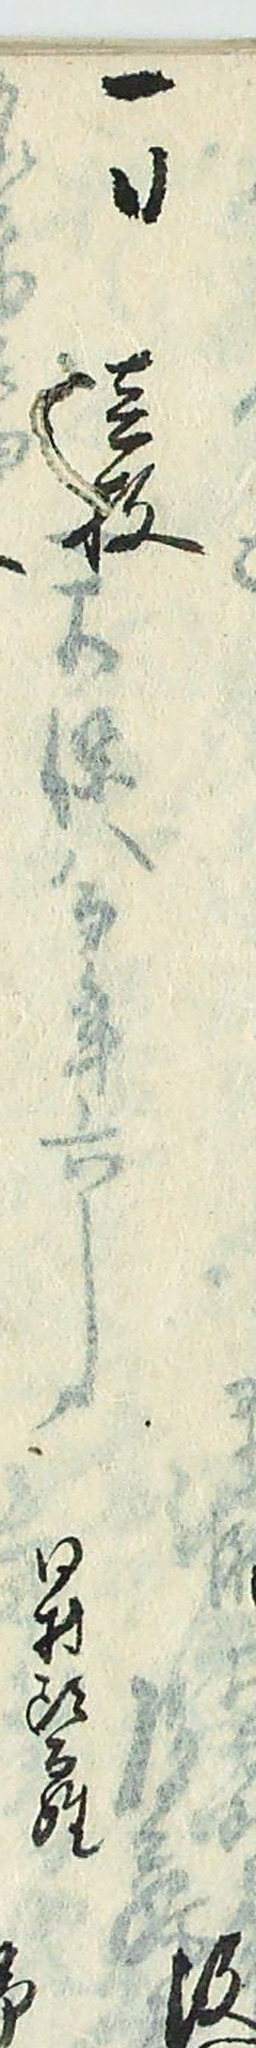一同壱枚同村頭百姓
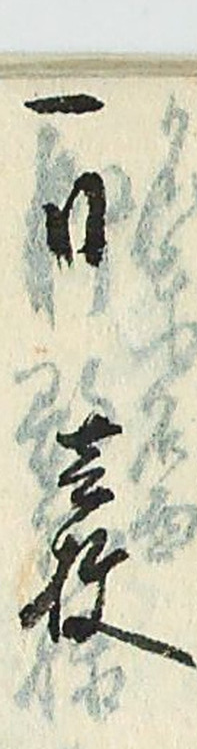一同壱枚同
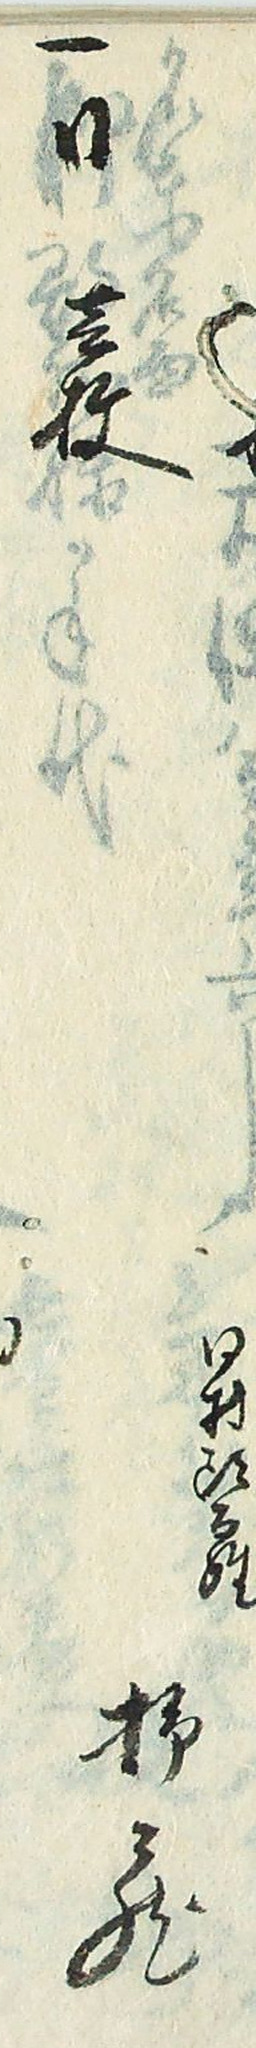一同壱枚同
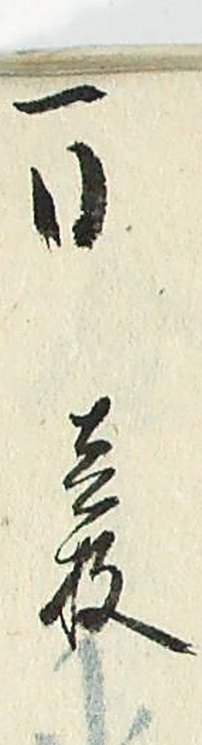一同壱枚同

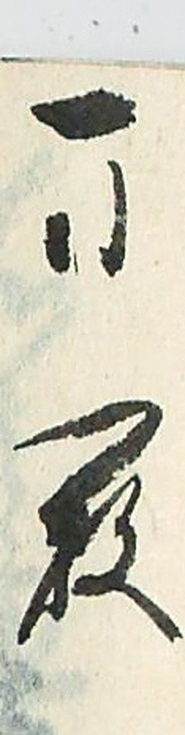一同一枚同
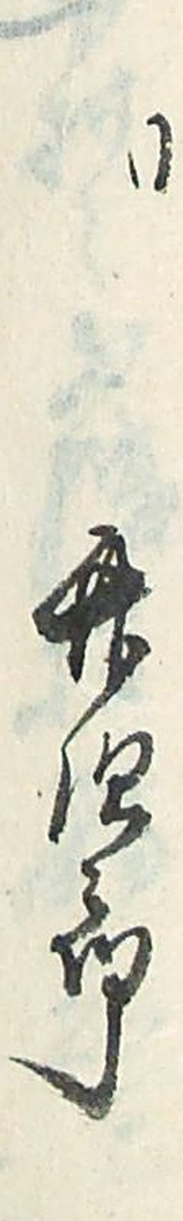竹次郎
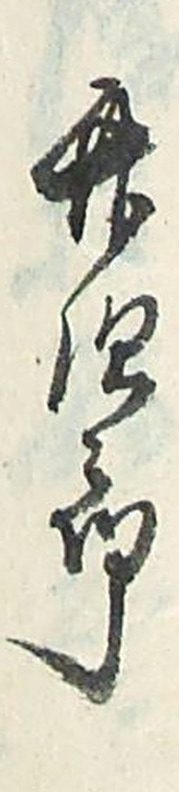竹次郎
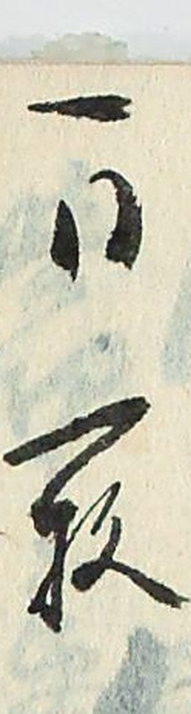一同一枚同
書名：諸御用御□受書控
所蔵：鳴門教育大学 Naruto University of Education
